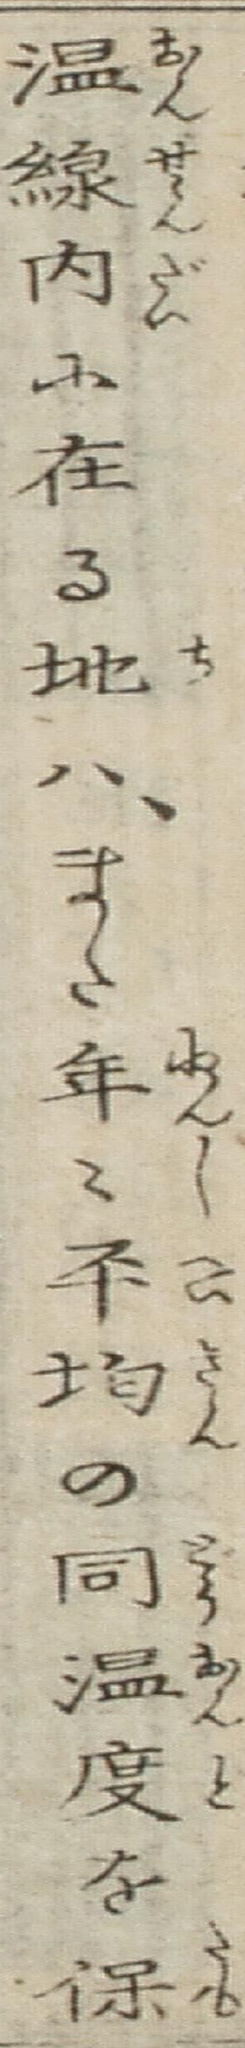温線内に在る地は、また年〻平均の同温度を保
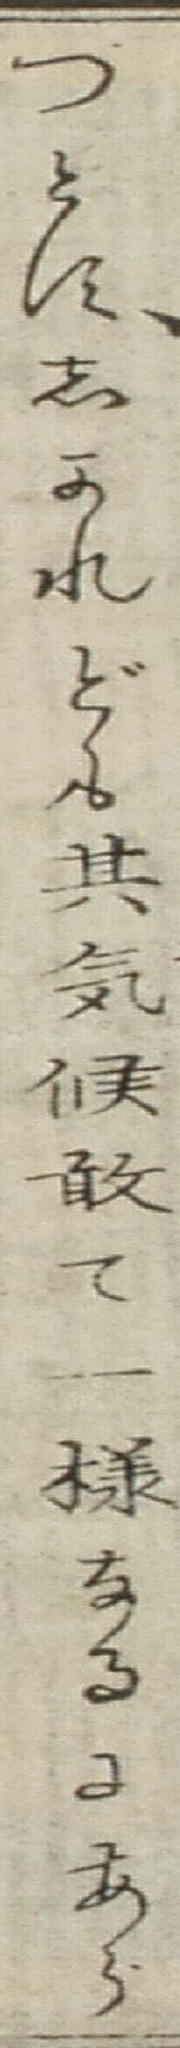つとす、しかれども其気候敢て一様なるにあら
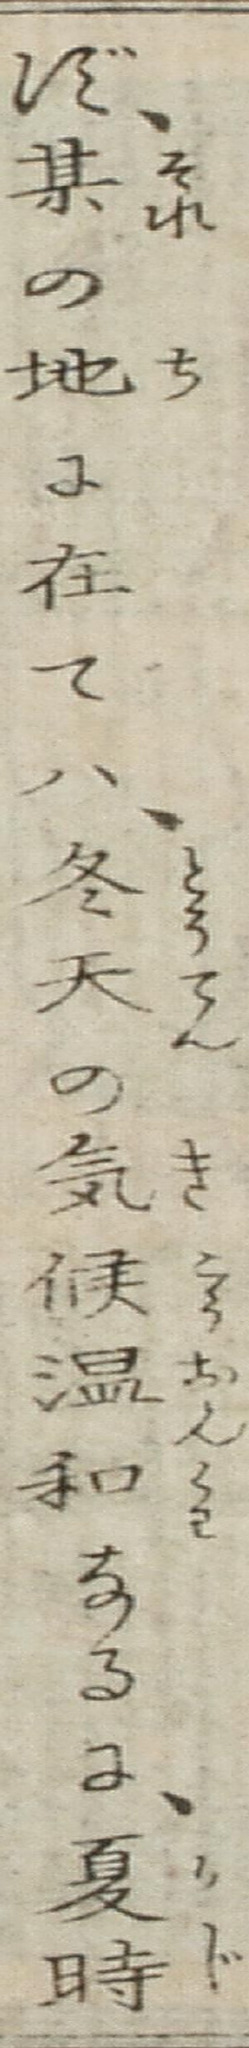ず、其の地に在ては、冬天の気候温和なるに、夏時
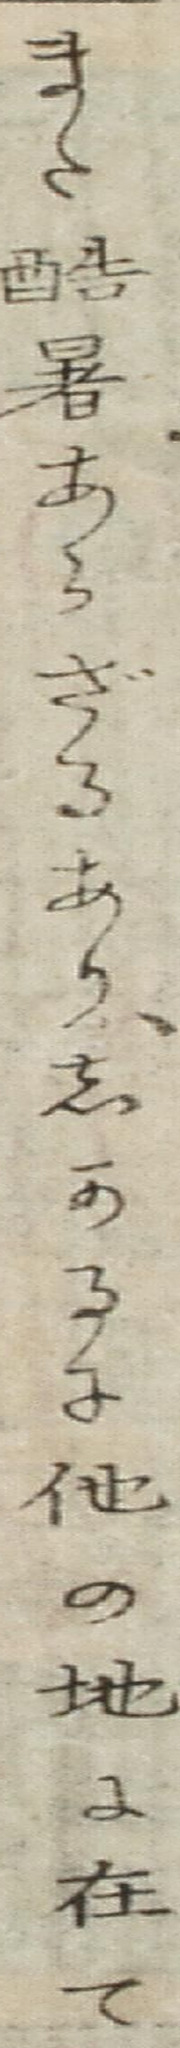また酷暑あらざるあり、しかるに他の地に在て
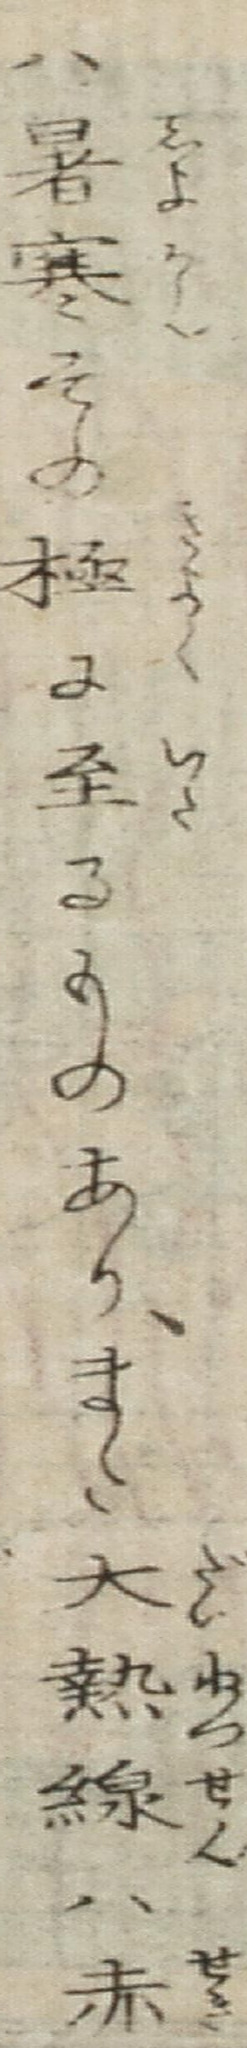は暑寒その極に至るものあり、また大熱線は赤
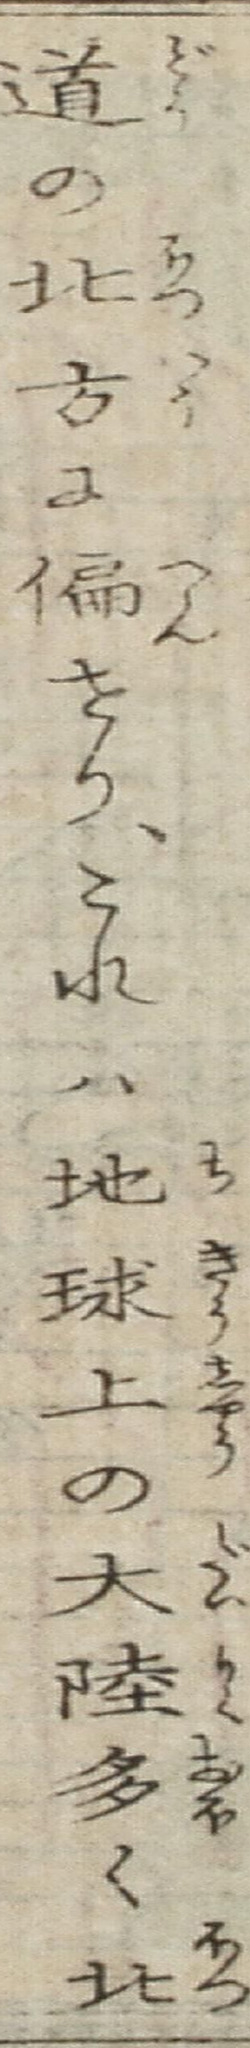道の北方に偏せり、これは地球上の大陸多く北
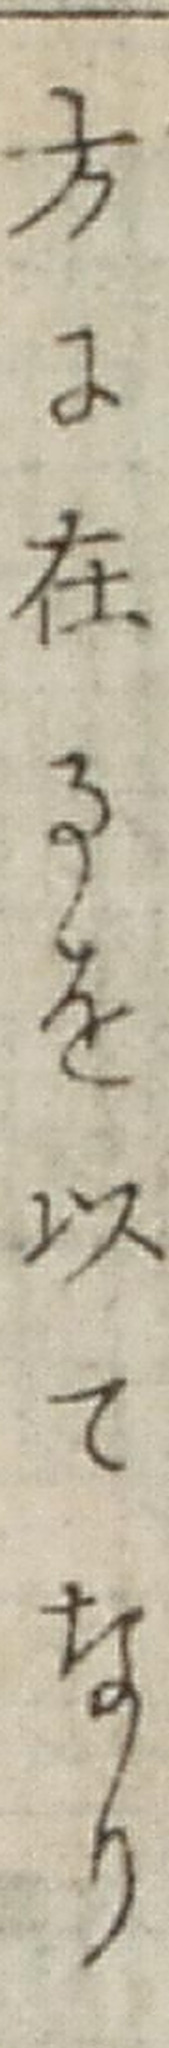方に在るを以てなり
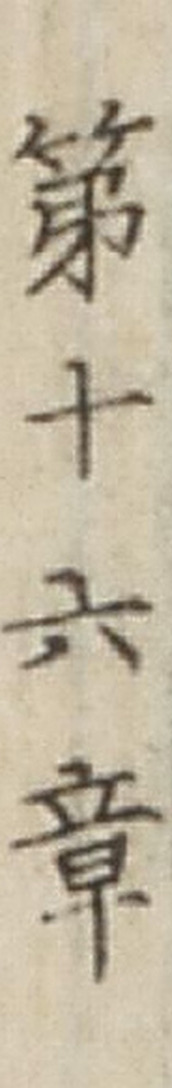第十六章
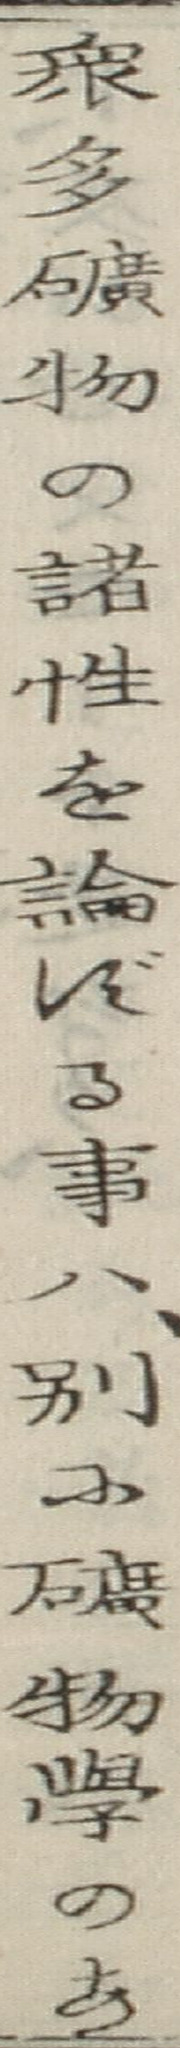衆多鉱物の諸性を論ずる事は、別に鉱物学のあ
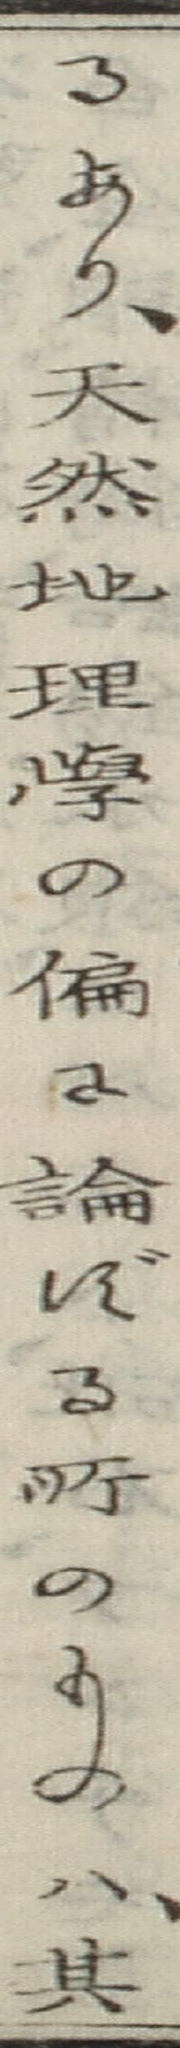るあり、天然地理学の偏に論ずる所のものは、其
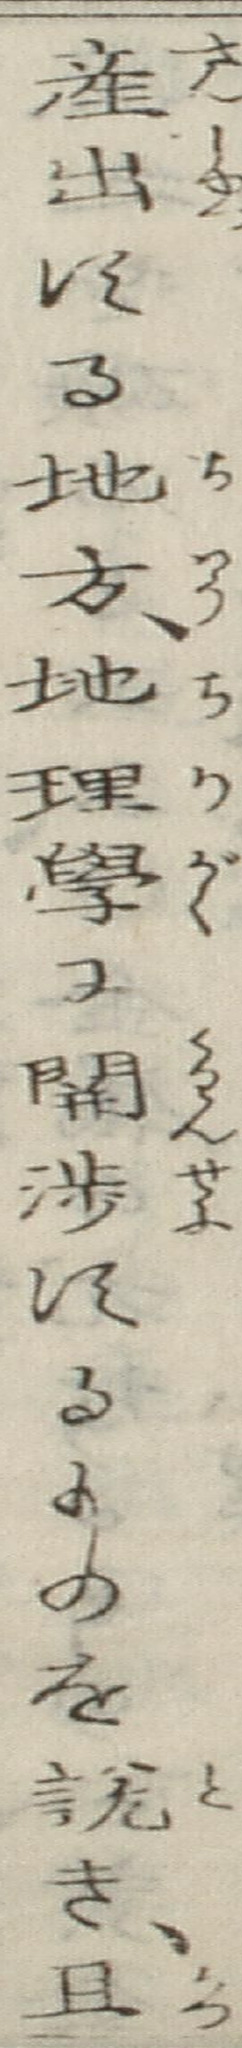産出する地方、地理学に関渉するものを説き、且
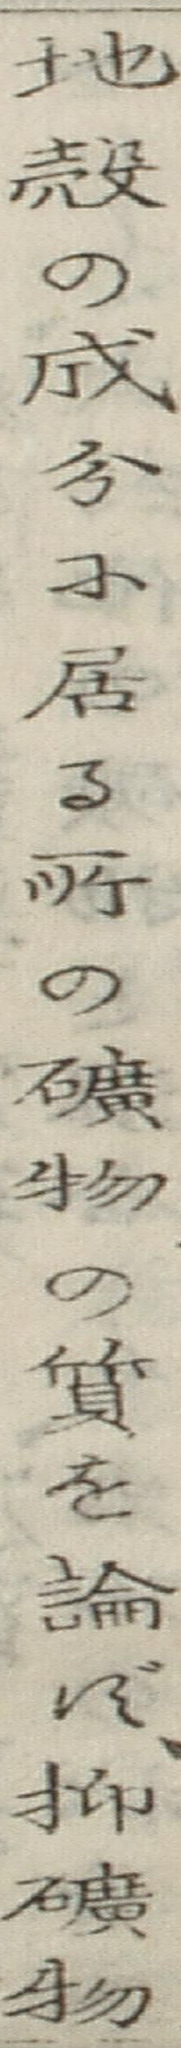地殻の成分に居る所の鉱物の質を論ず、抑鉱物
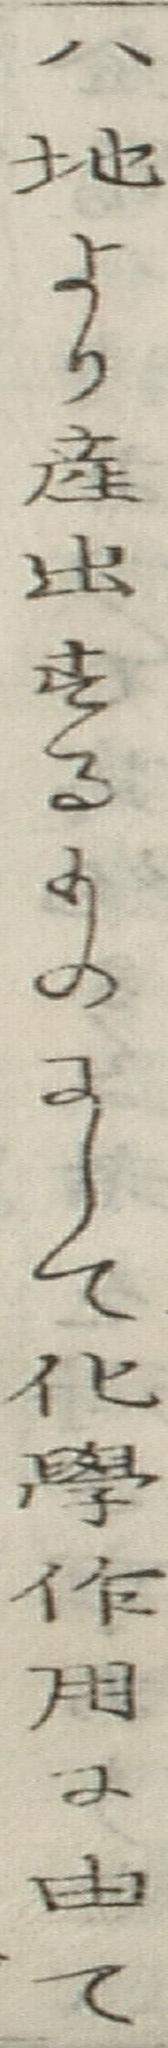は地より産出するものにして、化学作用に由て
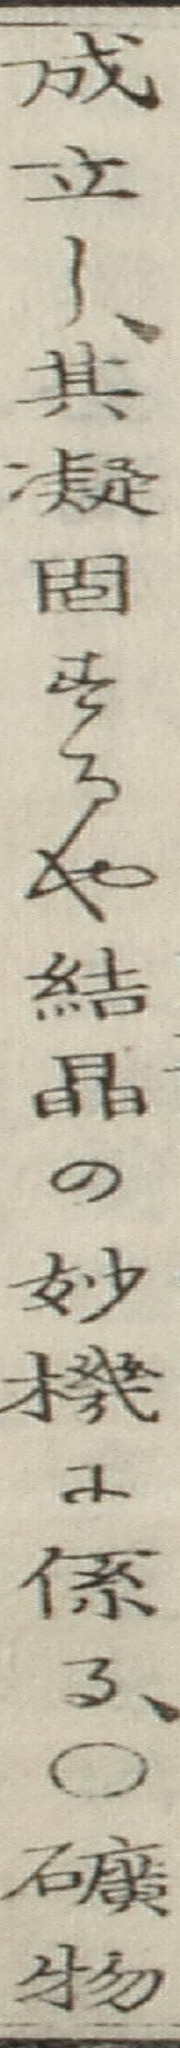成立し、其凝固するや結晶の妙機に係る、○鉱物
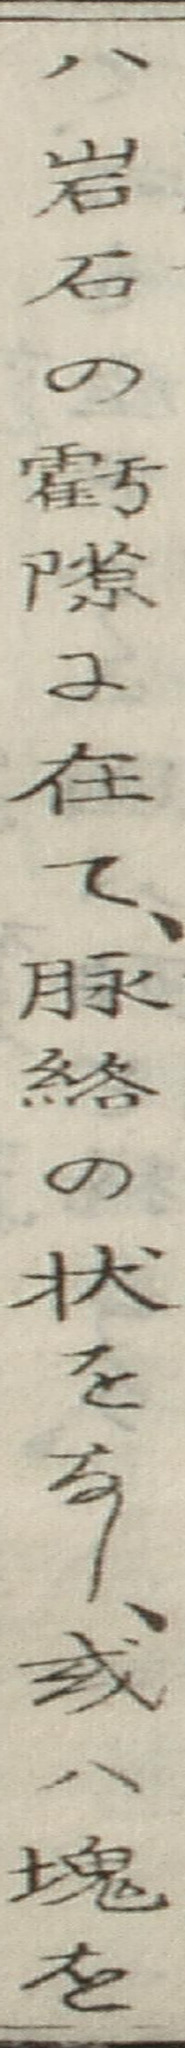は岩石の虧隙に在て、脈絡の状をなし、或は塊を
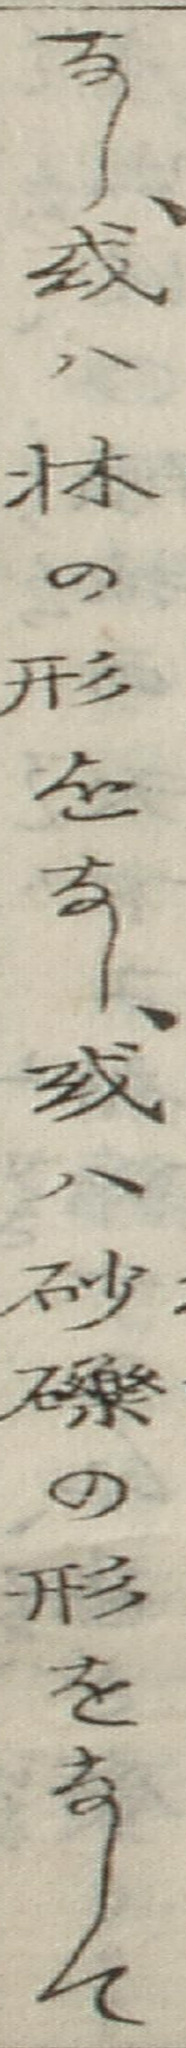なし、或は牀の形をなし、或は砂礫の形をなして
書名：訓蒙　天然地理學　下
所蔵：東京大学地震研究所図書室 Earthquake Research Institute Library, The University of Tokyo, JAPAN
